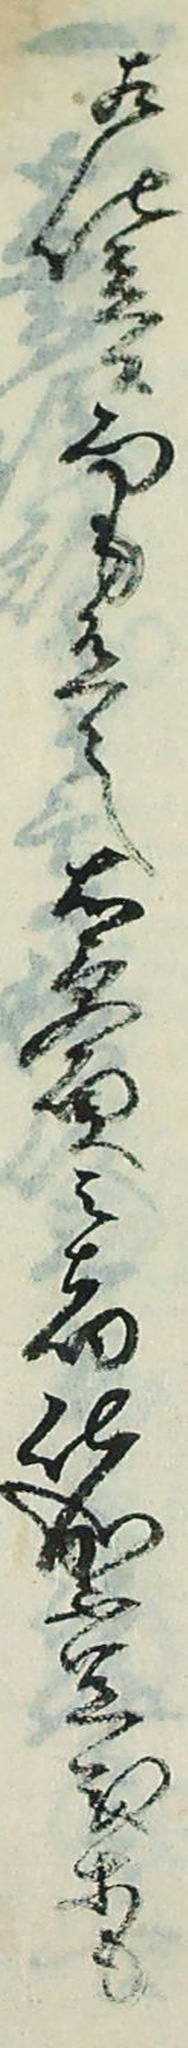相仕立候向も有之右受負之者仕成不宜義等も
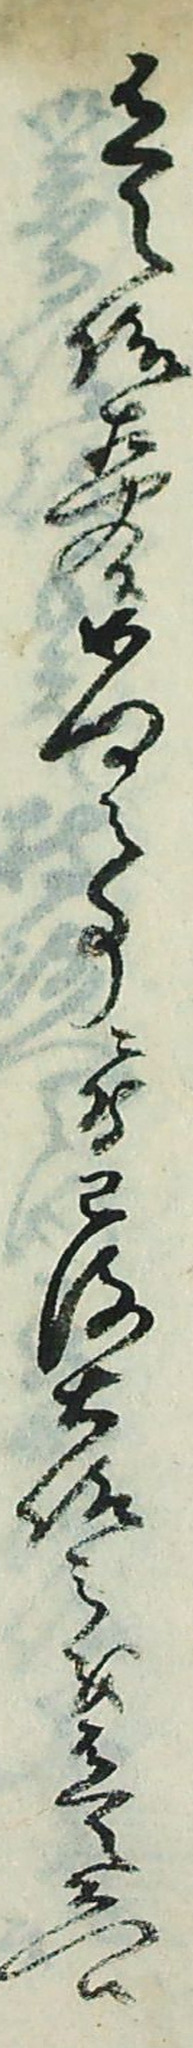有之様相聞候如何之事ニ付已後右様之義有之候へハ
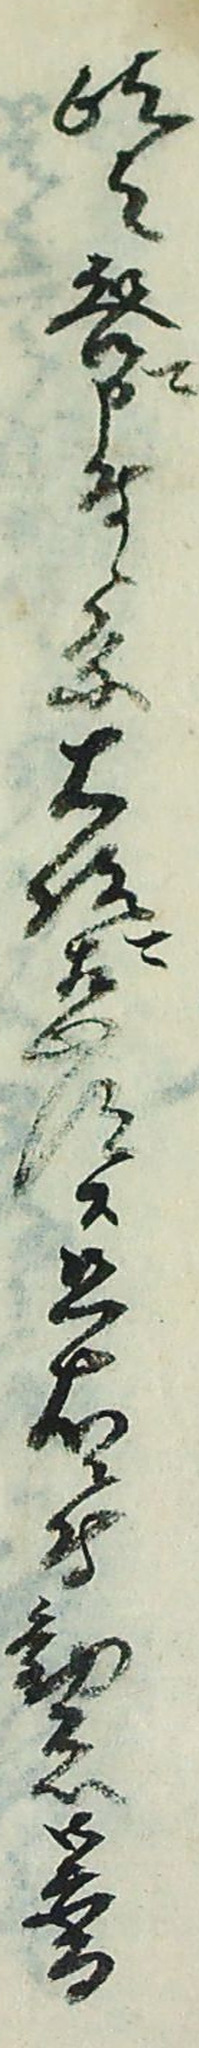屹と咎可申付候条右様可相心得候且右ニ付勧農御普
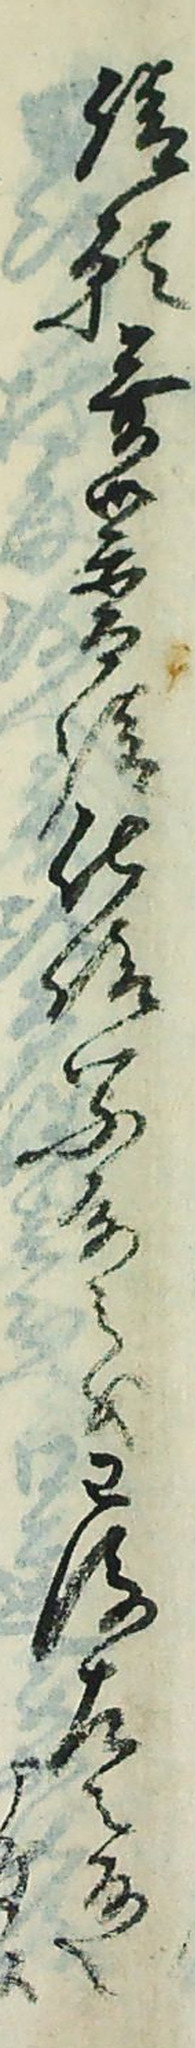請願幷御普請仕様写取之義已後左之通申付候
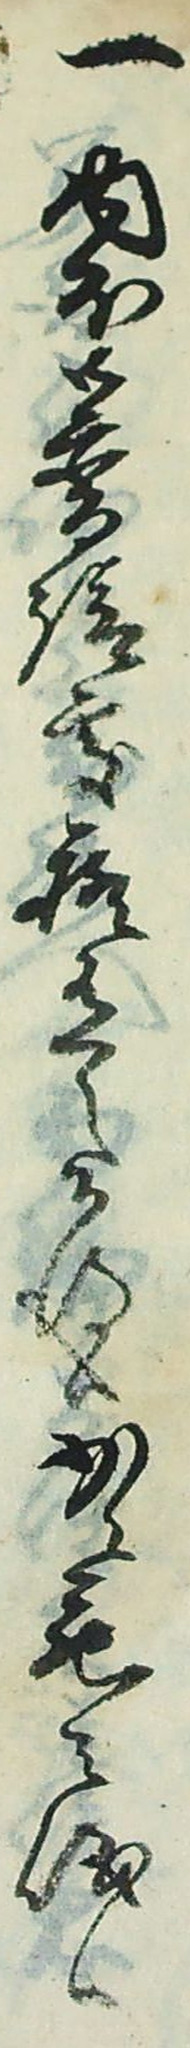一内外御普請處疼有之候得ハ少々宛之儀候
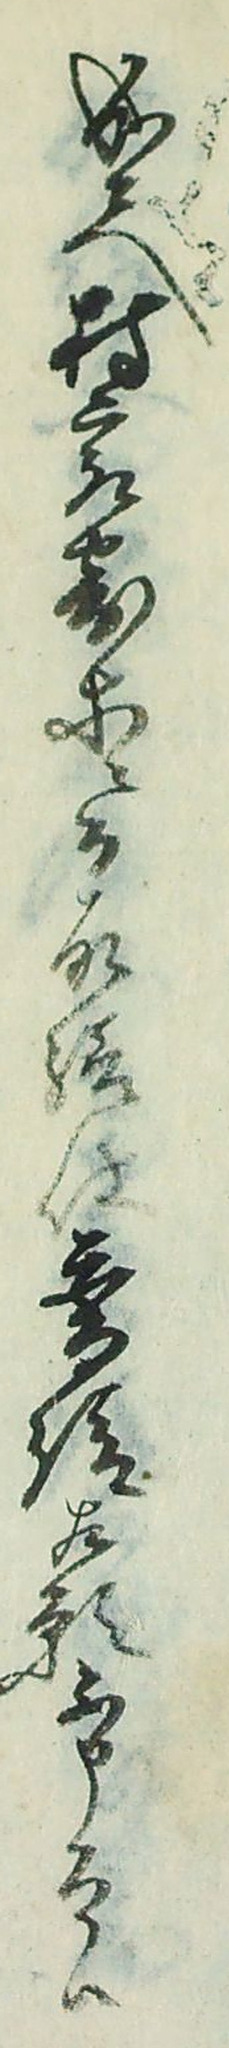成尺村最寄等ニ而取繕仕普請相願不申而ハ
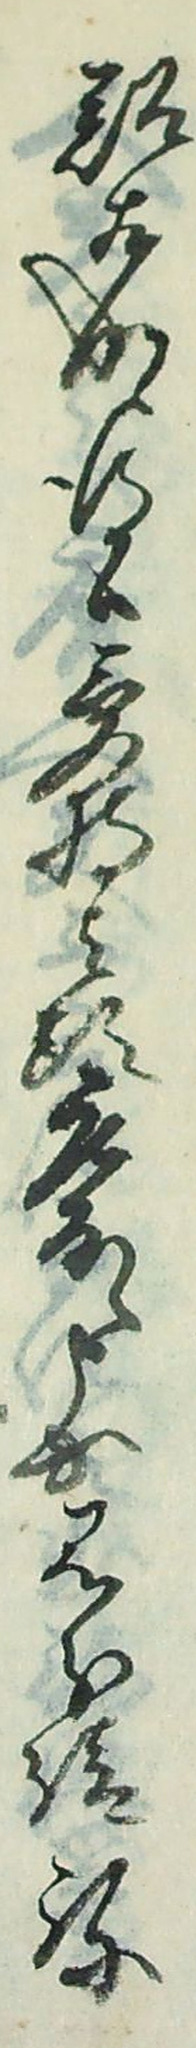難相成候得ハ受持与頭庄屋へ申出見分請弥
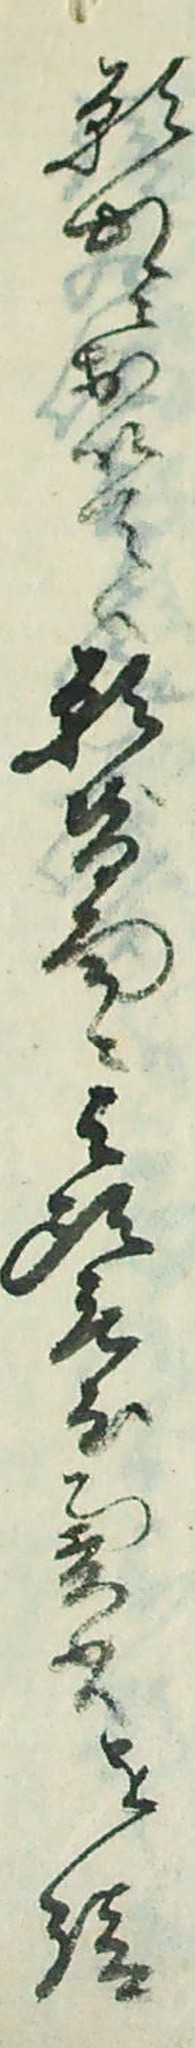願出候ニおいてハ願帋面ニ与頭庄屋奥書を請
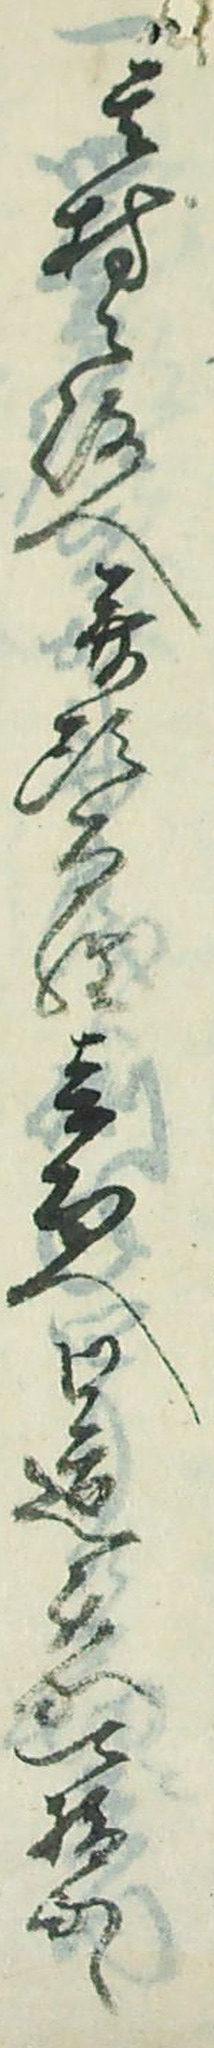其村々役人幷頭百姓壱両人同道罷出可指出候
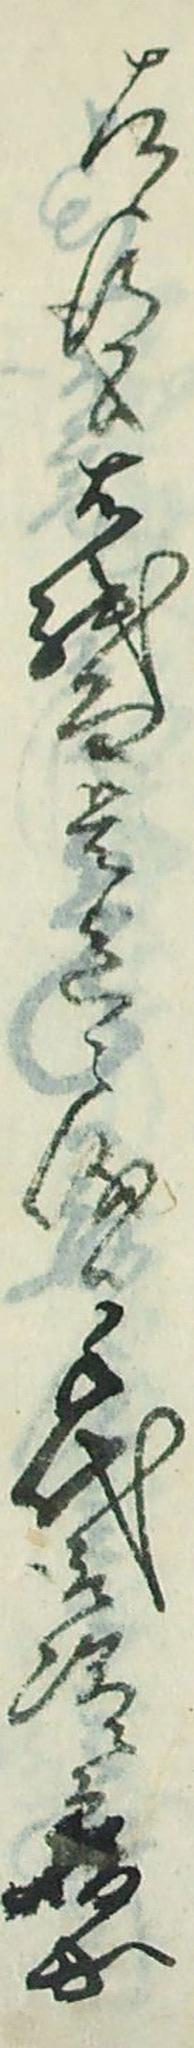左候得ハ右紙面是迄之儀ハ手代取次ニ而指出

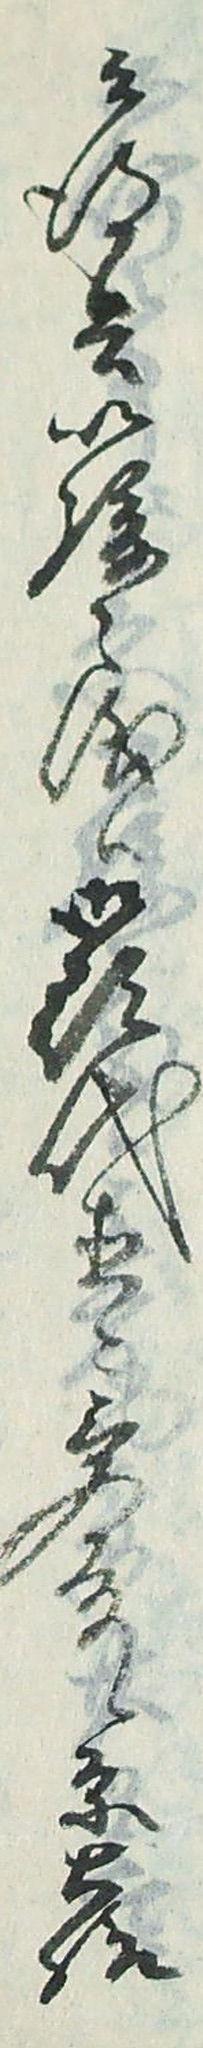候得共以後之儀ハ御郡代直々受取候条右様
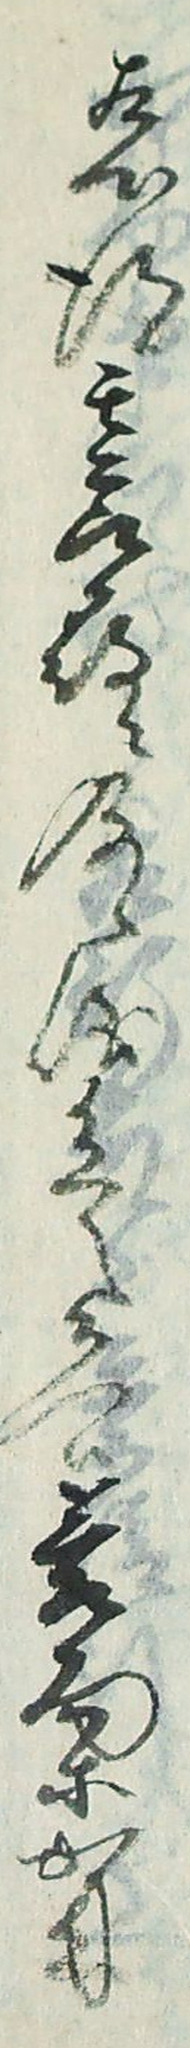相心得其節尋に及候儀有之候ヘハ暮向等出来
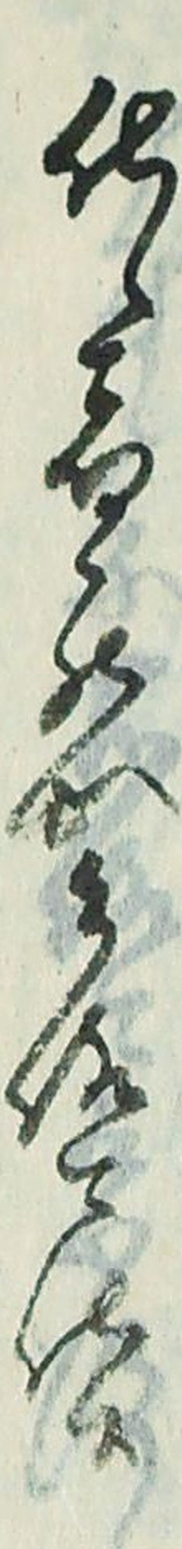仕候者罷出候様可仕候
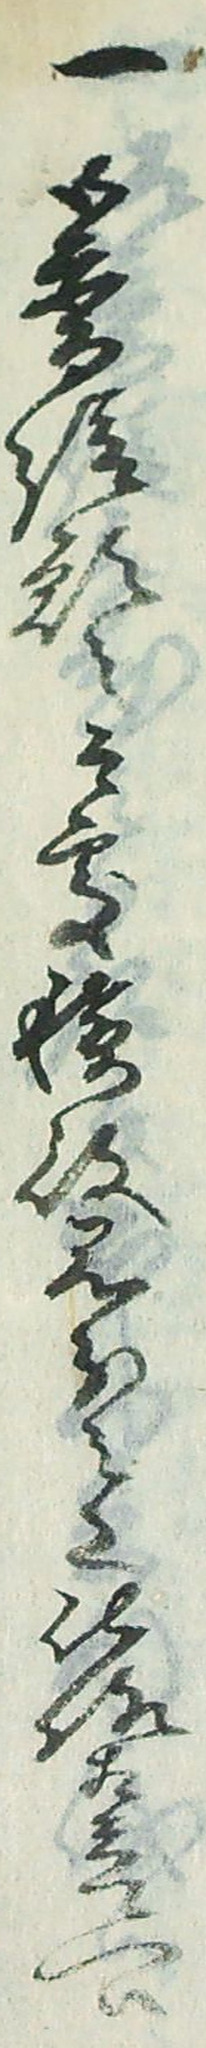一御普請願之其処積役見分之上仕様相立候へハ
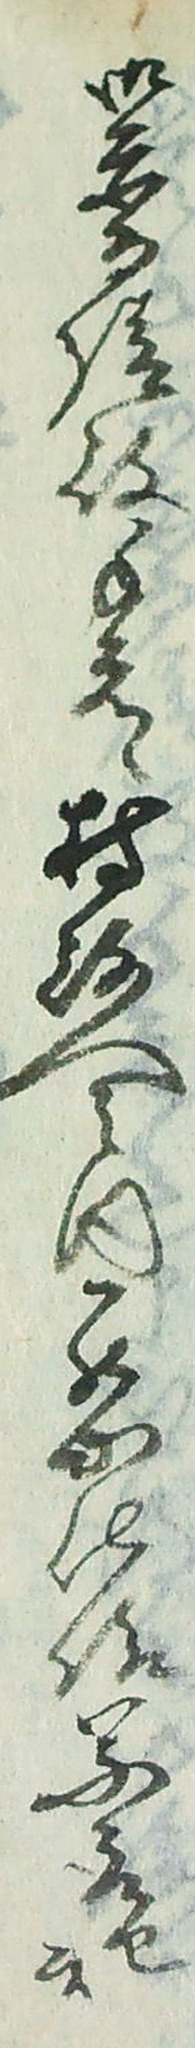御普請役手元へ村役人之内罷出仕様写取セ候
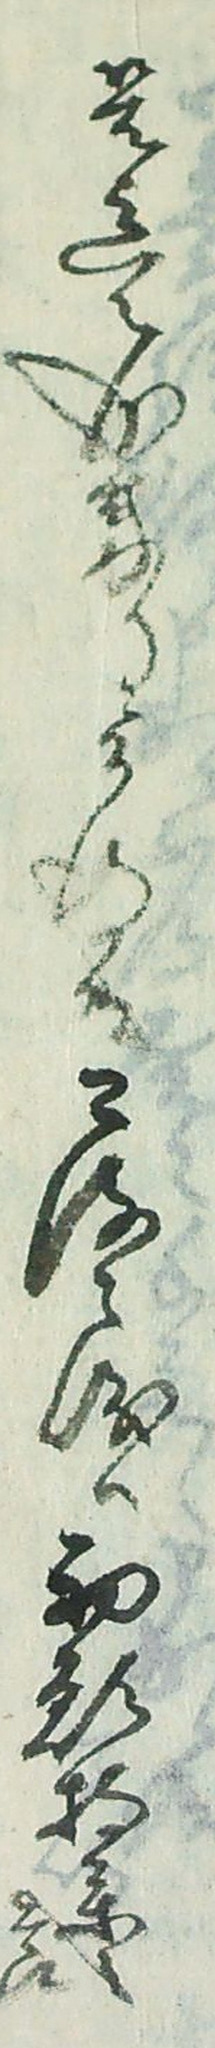是迄之成来りニ候得共已後之儀ハ初願持参之節
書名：諸御趣意書并御下知向之写
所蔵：鳴門教育大学 Naruto University of Education
